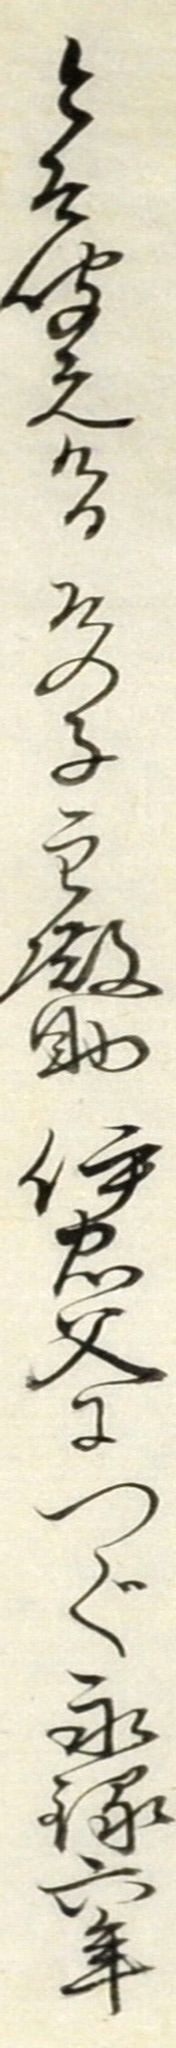とそ聞えけるその子主殿助伊忠父につぐ永禄六年
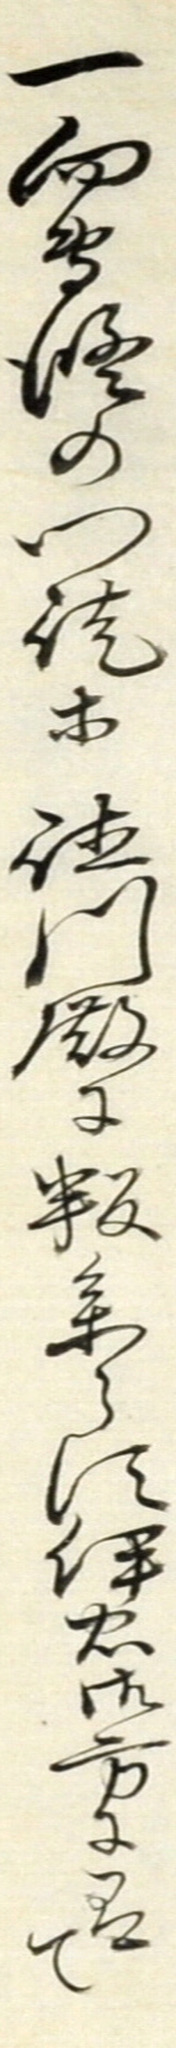一向専修の門徒等徳川殿に叛参らす伊忠御方に有て
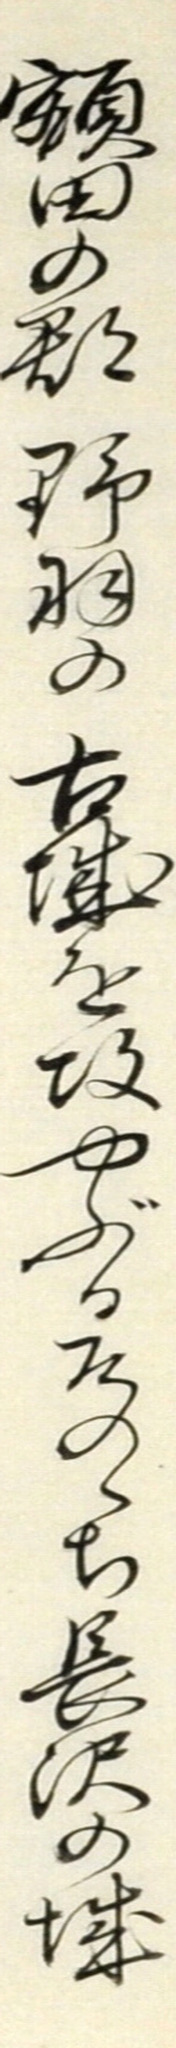額田の郡野羽の古城を攻やぶるそのゝち長沢の城
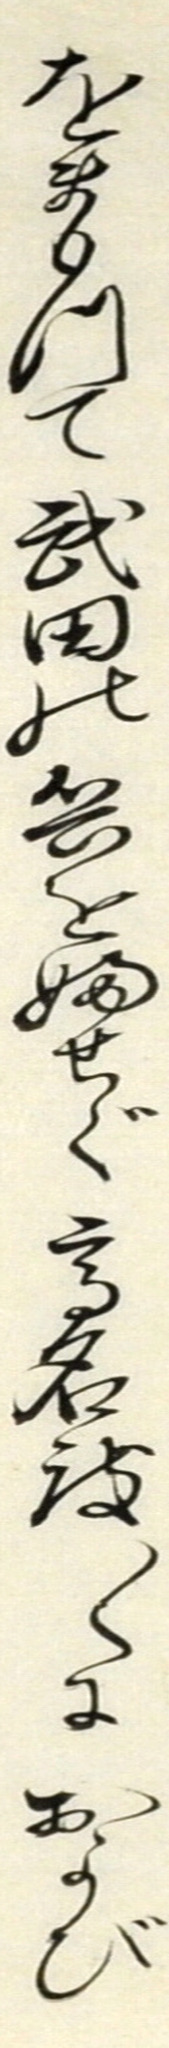をまもつて武田の兵をふせぐ高名度々におよび
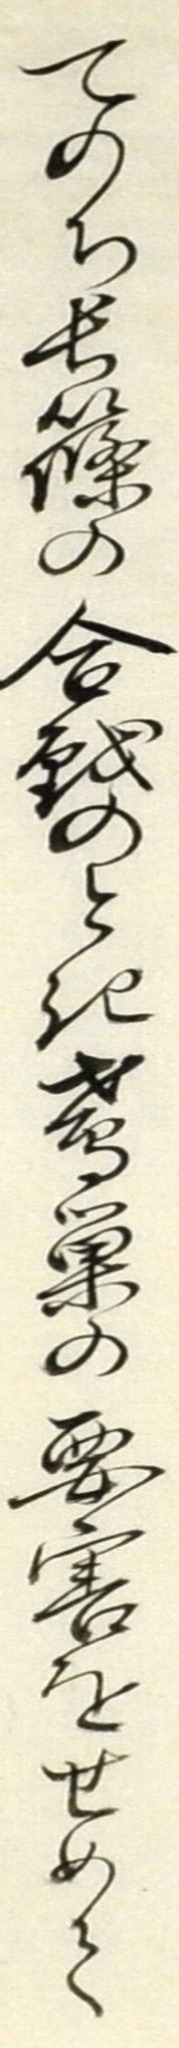てのち長篠の合戦のとき鳶巣の要害をせめて
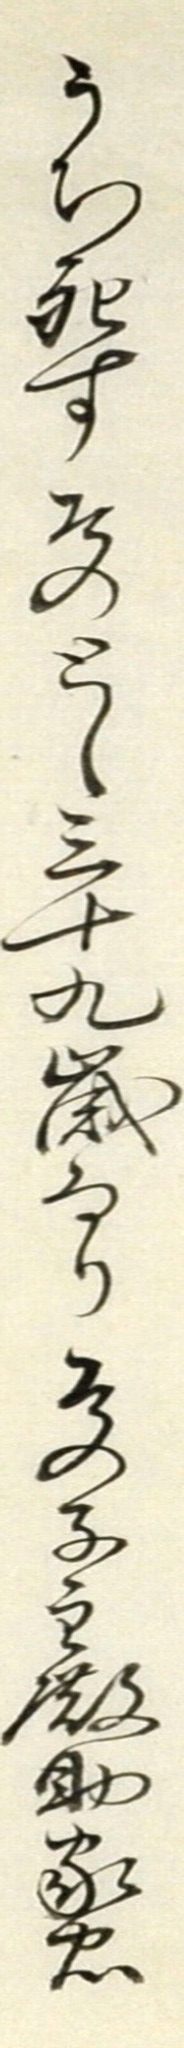うち死すそのとし三十九歳なりその子主殿助家忠
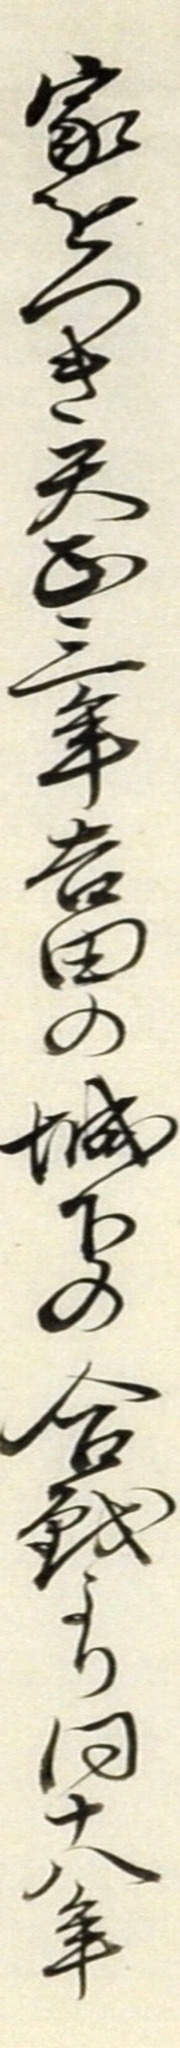家をつき天正三年吉田の城下の合戦より同十八年
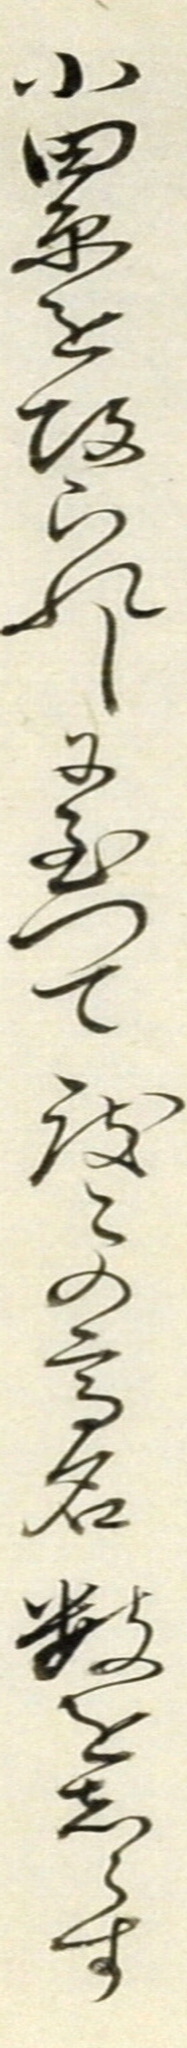小田原を攻られしに至つて度々の高名数をしらす
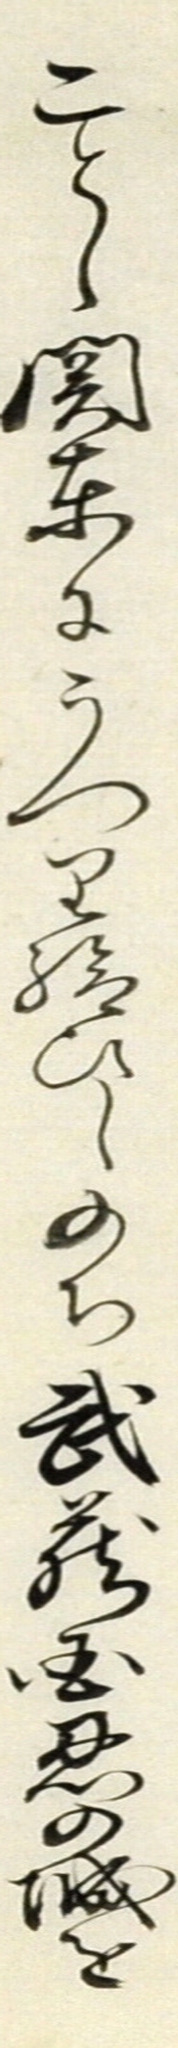ことし関東にうつり給ひしのち武蔵国忍の城を
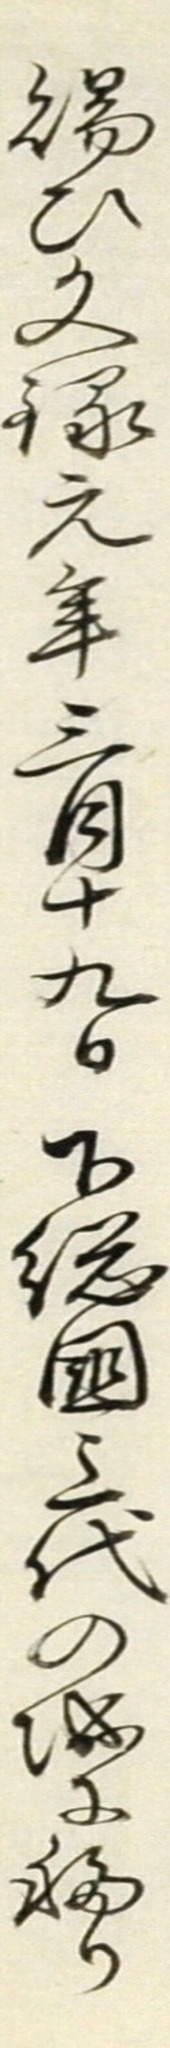賜ひ文禄元年三月十九日下総国上代の城に移り
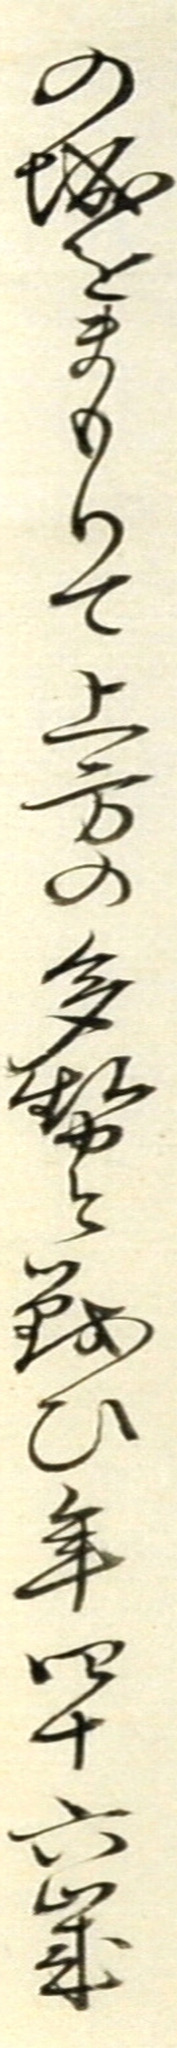の城をまもりて上方の多勢と戦ひ年四十六歳

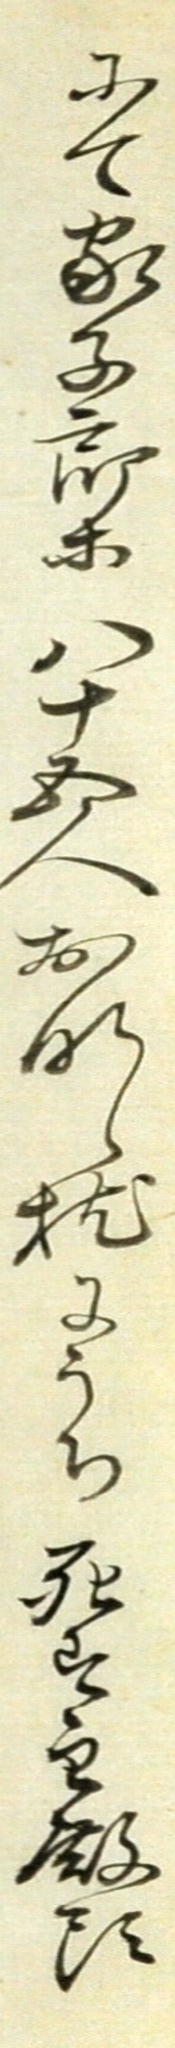にて家子郎等八十五人おなし枕にうち死す主殿頭
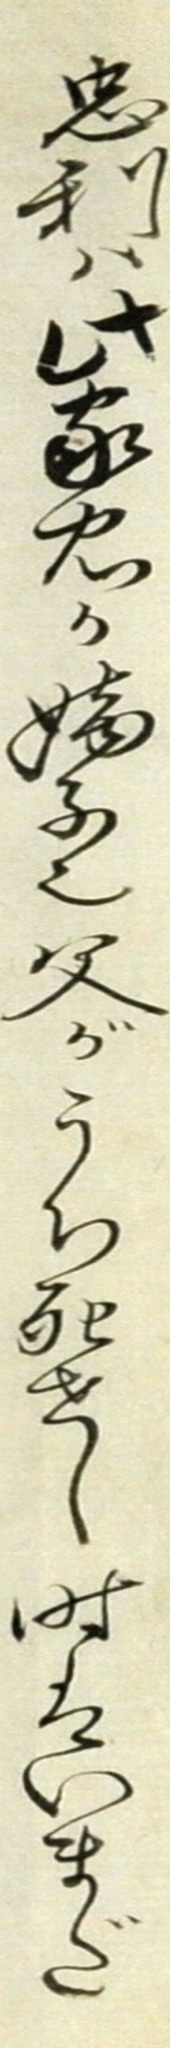忠利は此家忠か嫡子也父がうち死せし時はいまだ
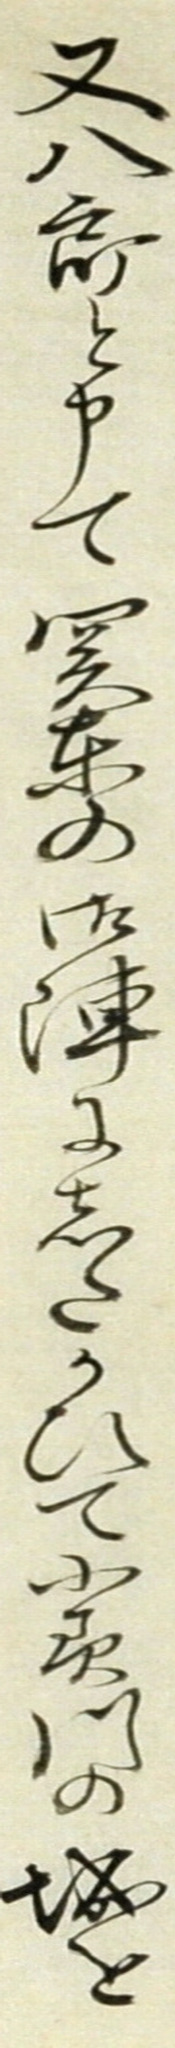又八郎と申て関東の御陣にしたかひて小美川の城を
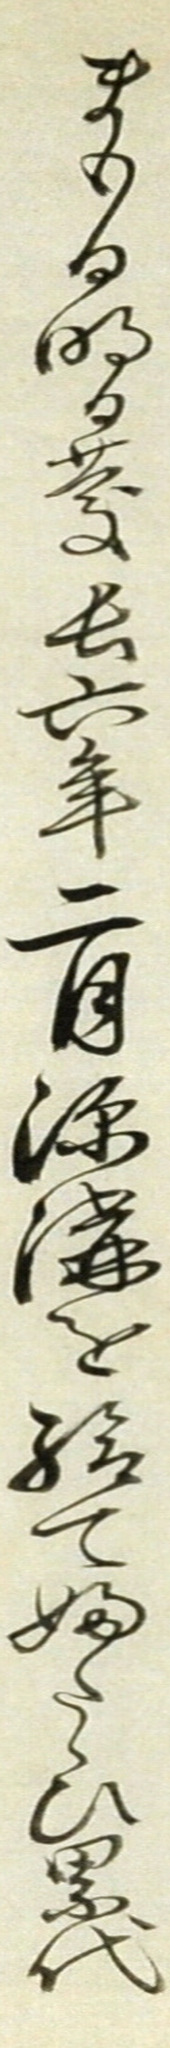まもる明る慶長六年二月深溝を給てふたゝひ累代
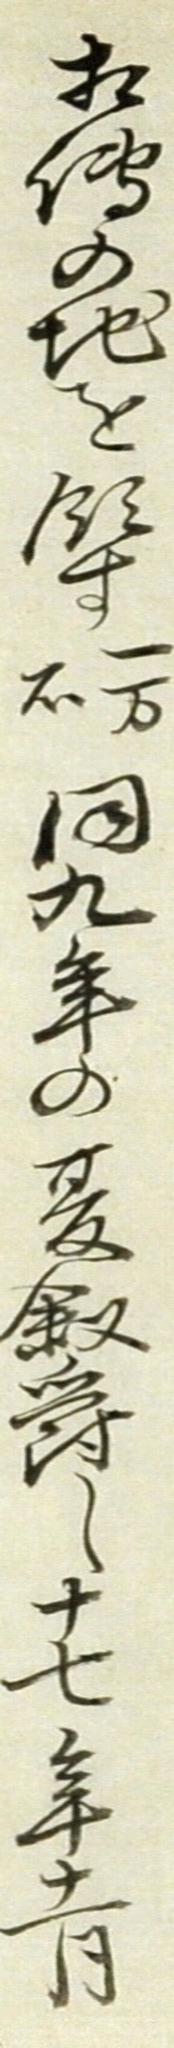相伝の地を領す一万石同九年の夏叙爵し十七年十一月
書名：藩翰譜（二・三）
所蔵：伊那市立高遠町図書館・合同会社AMANE
